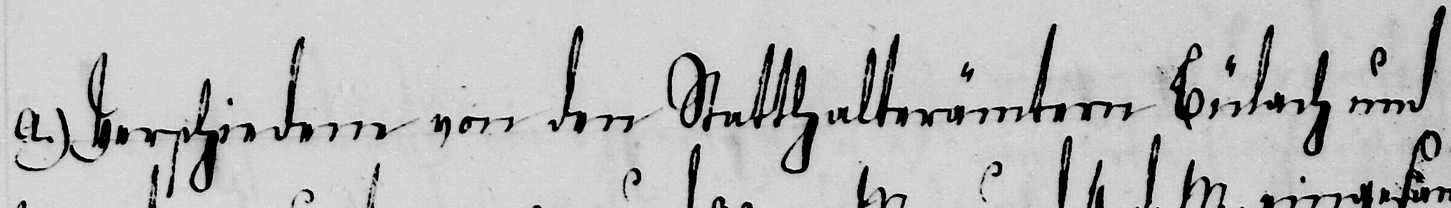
a.) Verschiedene von den Statthalterämtern Bülach und
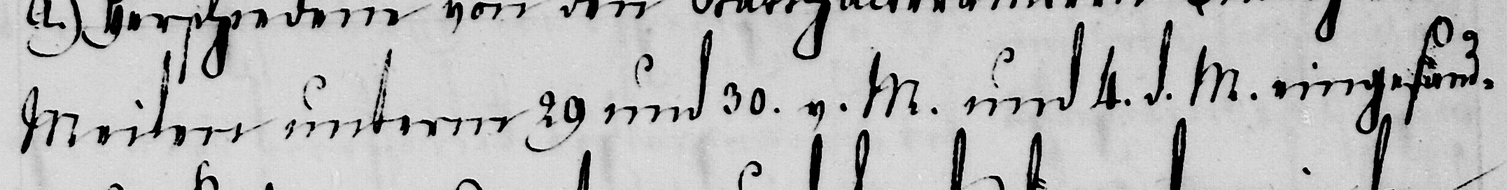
Meilen unterm 29. und 30. v. M. und 4. d. M. eingesand¬
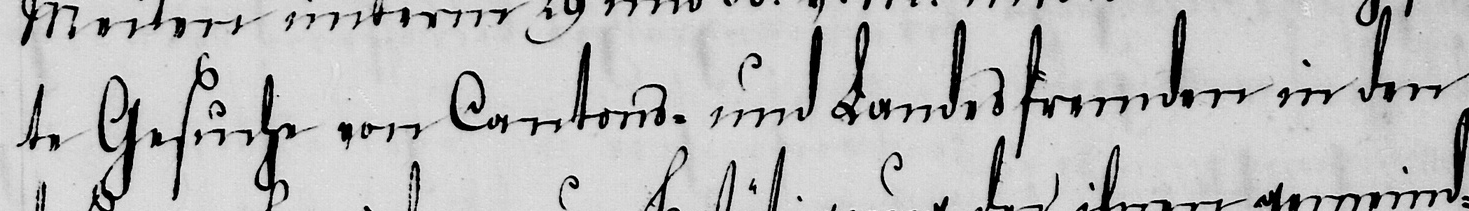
te Gesuche von Cantons- und Landesfremden in den
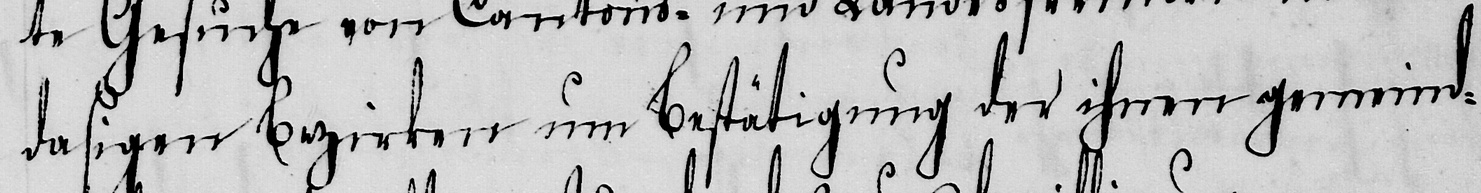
dasigen Bezirken und Bestätigung der ihnen gemeind¬
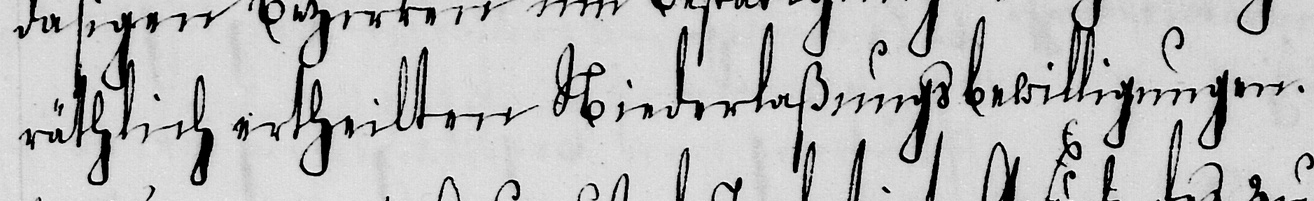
räthlich ertheilten Niederlaßungsbewilligungen.
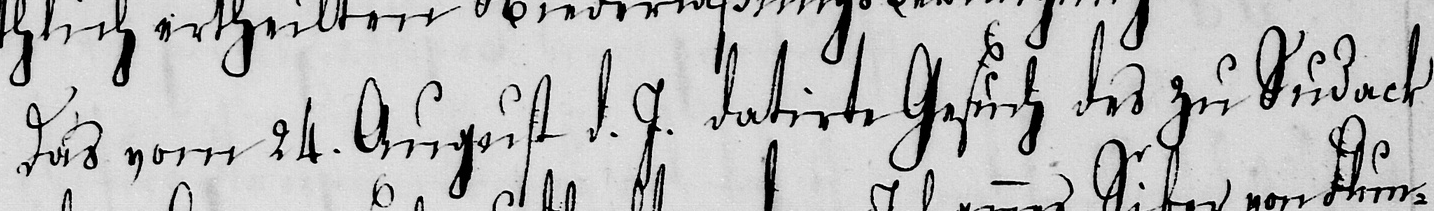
Das vom 24. August d. J. datirte Gesuch des zu Sudack
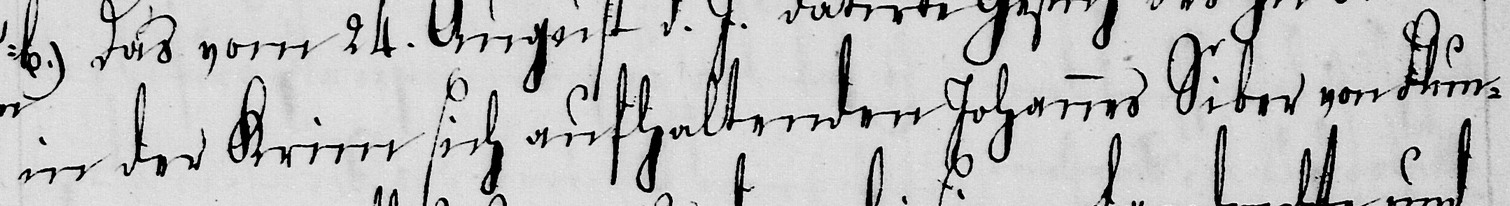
in der Krime sich aufhaltenden Johannes Siber von Flun¬
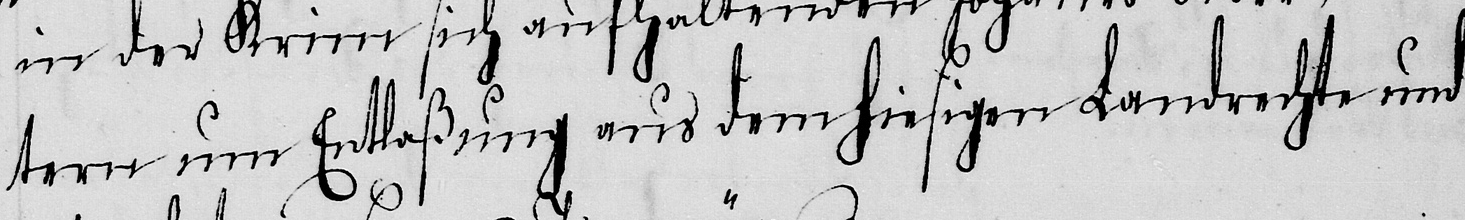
tern um Entlaßung aus dem hiesigen Landrechte und
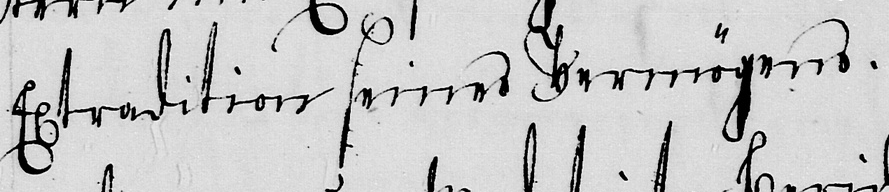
Extradition seines Vermögens.
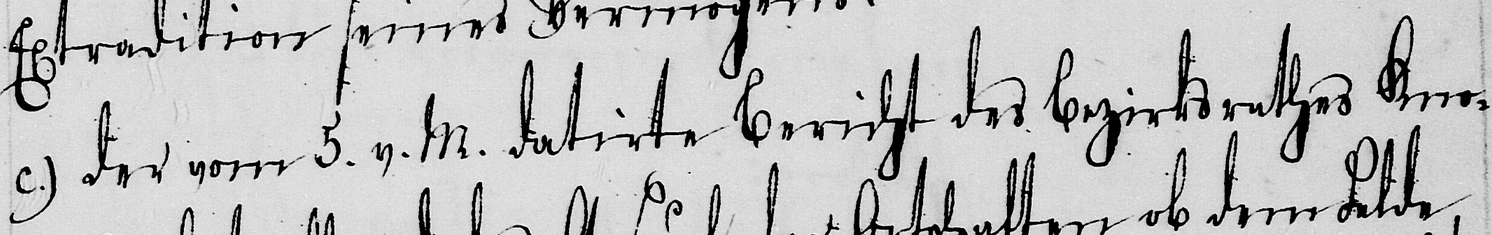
c.) der vom 5. v. M. datirte Bericht des Bezirksrathes Kno¬
